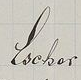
Escher
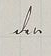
der
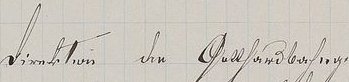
Direktion der Gotthardbahnge-
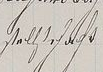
sellschaft
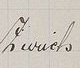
Zürich
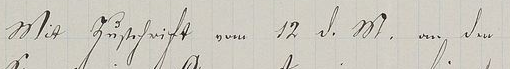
Mit Zuschrift vom 12. d. M. an den
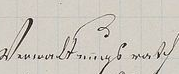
Verwaltungsrath
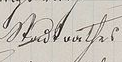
erklären Sie,
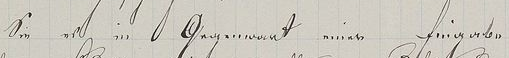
Sie es in Gegenwart einer Eingabe
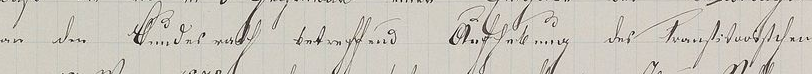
an den Bundesrath betreffend Aufhebung des transitorischen
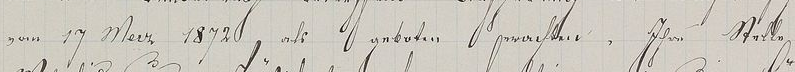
vom 17. Merz 1872 als geboten erachten, Ihre Stelle
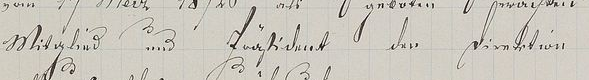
Mitglied und Präsident der Direktion
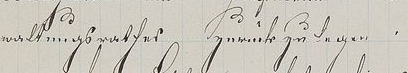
waltungsrathes zurückzulegen.
